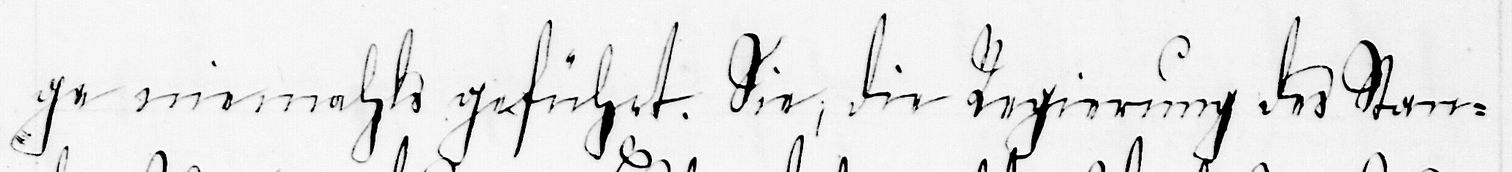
ge niemahls geführt. Sie, die Regierung des Stan¬
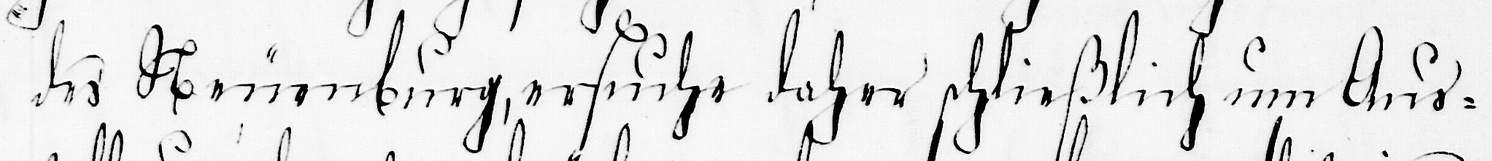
des Neuenburg, ersuche daher schließlich um Aus¬
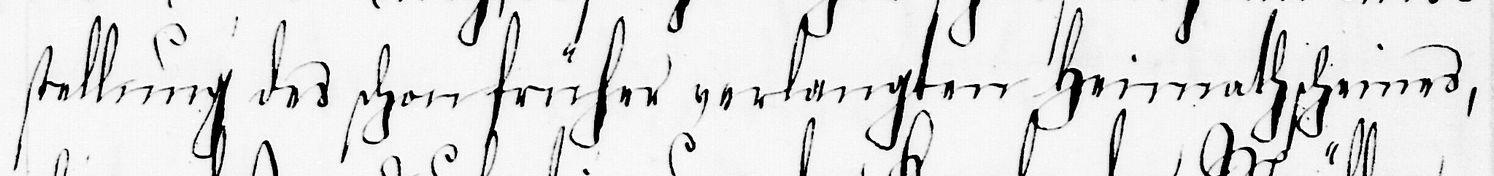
tellung des schon früher verlangten Heimathscheines,
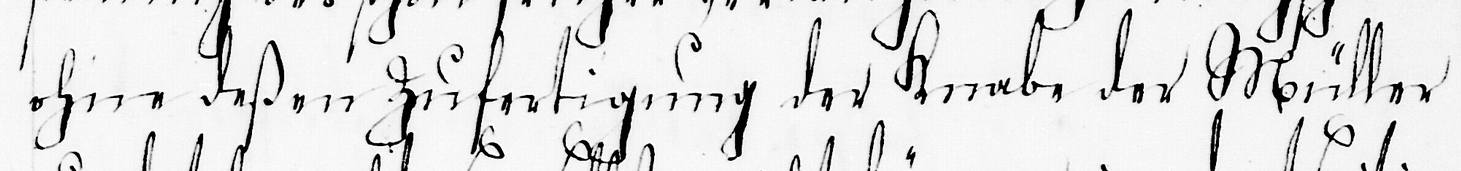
ohne deßen Zufertigung der Knabe der Müller
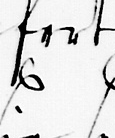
s¬
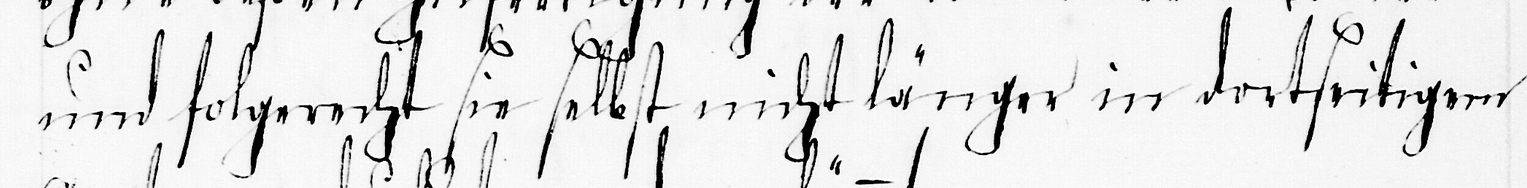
und folgerecht sie selbst nicht länger in dortseitigem
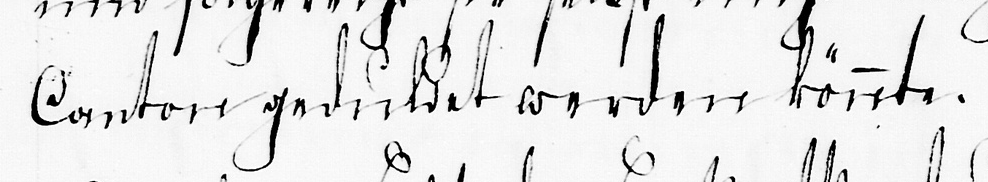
Canton geduldet werden könnte.
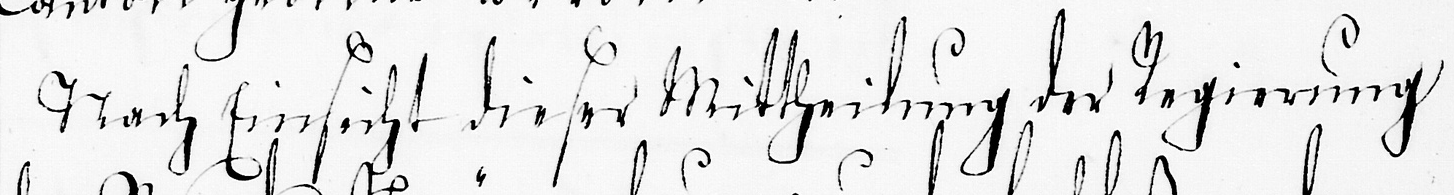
Nach Einsicht dieser Mittheilung der Regierung
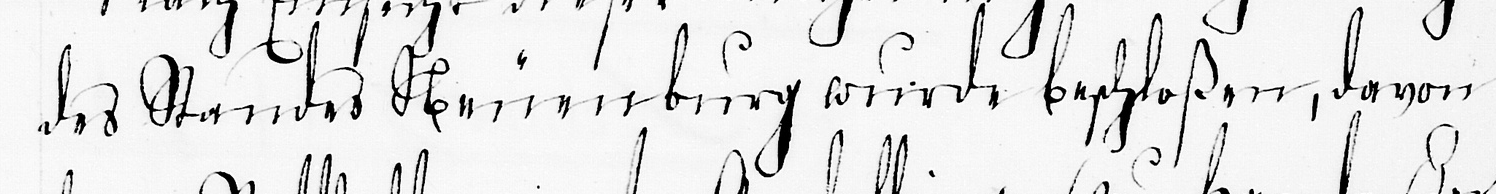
des Standes Neuenburg wurde beschloßen, davon
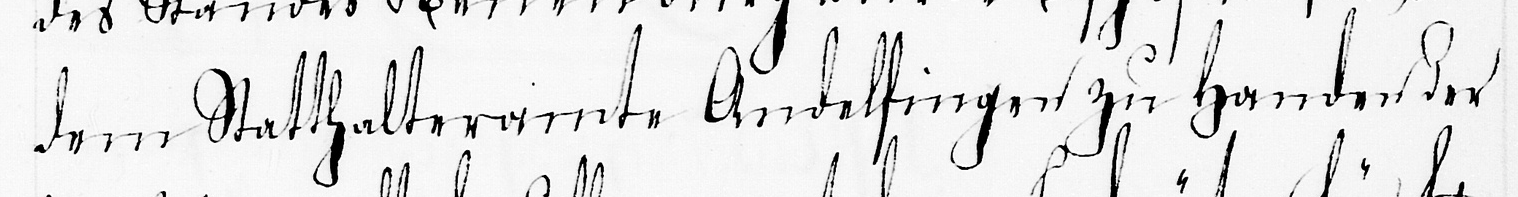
dem Statthalteramte Andelfingen zu Handen der
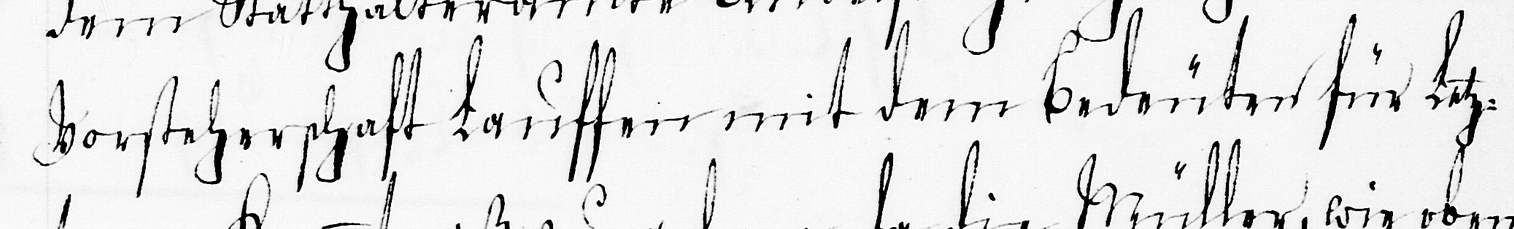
Vorsteherschaft Lauffen mit dem Bedeuten für Let¬
